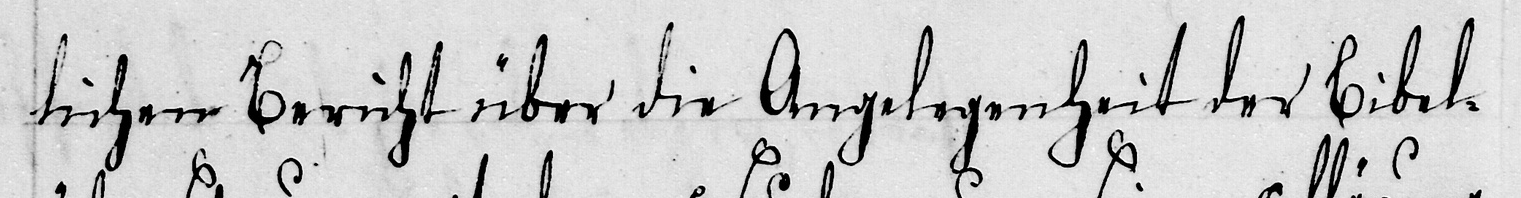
lichen Bericht über die Angelegenheit der Bibel¬
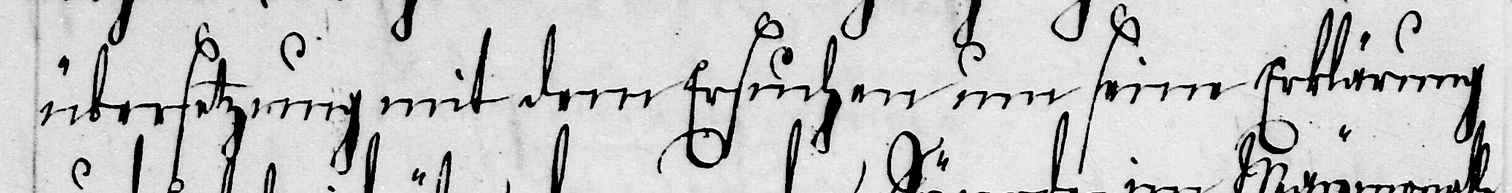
übersetzung mit dem Ersuchen um seine Erklärung
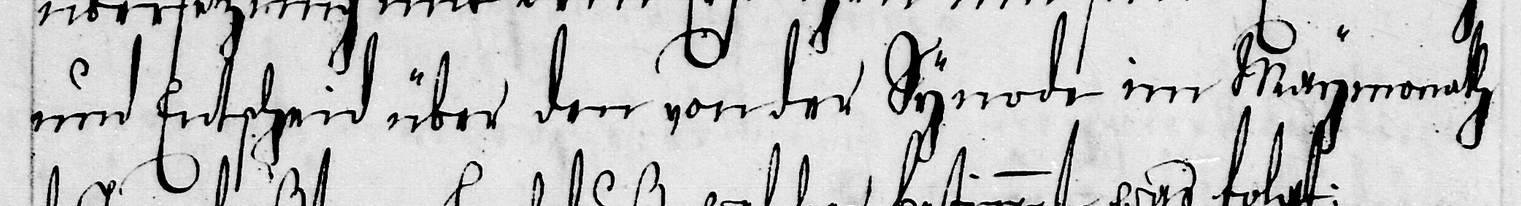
und Entscheid über den von der Synode im Maymonath
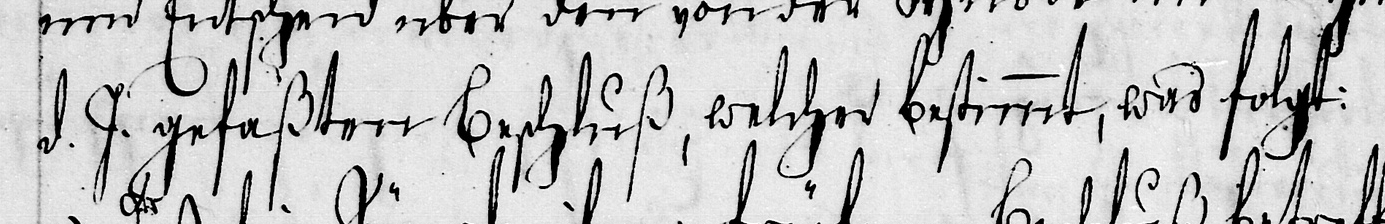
d. J. gefaßten Beschluß, welcher bestimmt, was folgt:
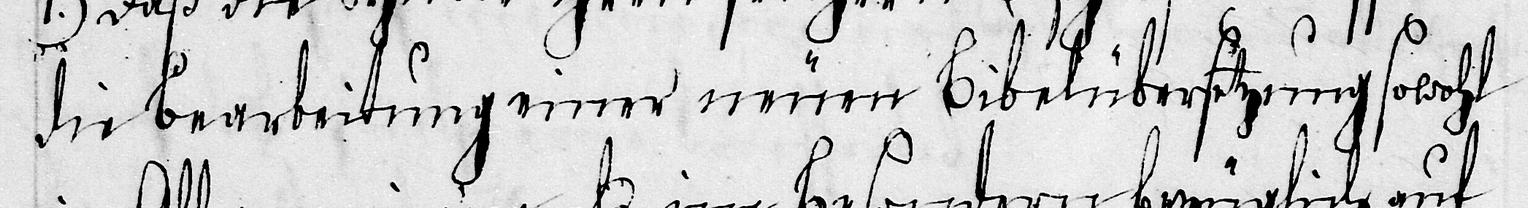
die Bearbeitung einer neuen Bibelübersetzung sowohl
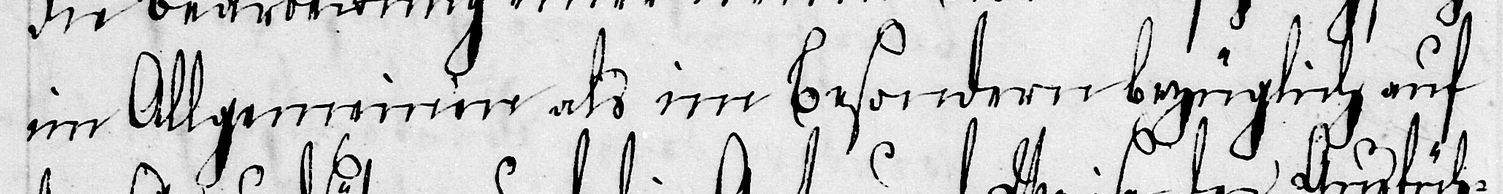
im Allgemeinen als im Besondern bezüglich auf
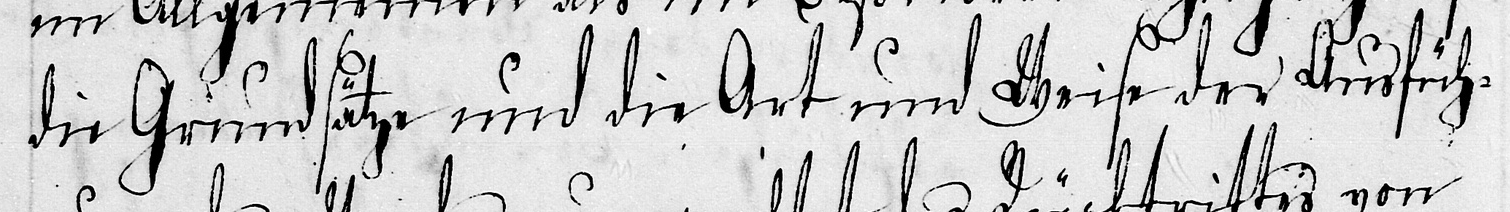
die Grundsätze und die Art und Weise der Ausfüh¬
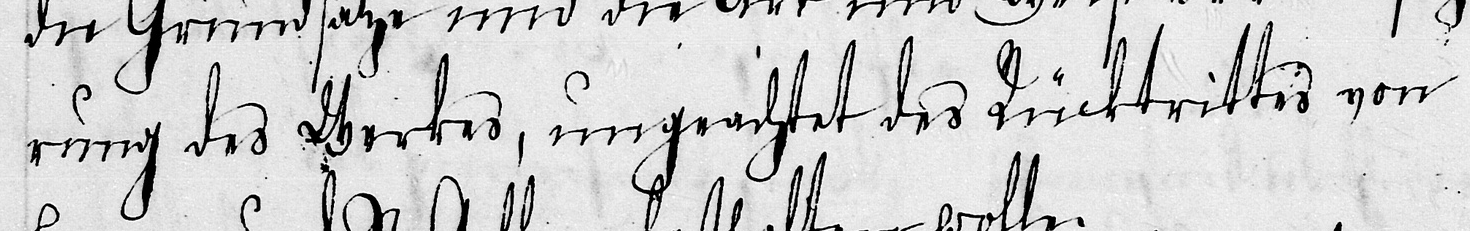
rung des Werkes, ungeachtet des Rücktrittes von
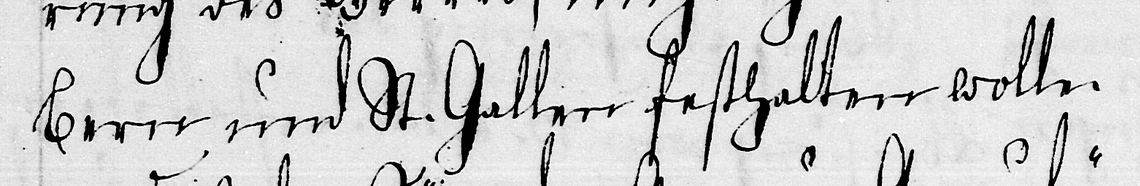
Bern und St. Gallen festhalten wolle.
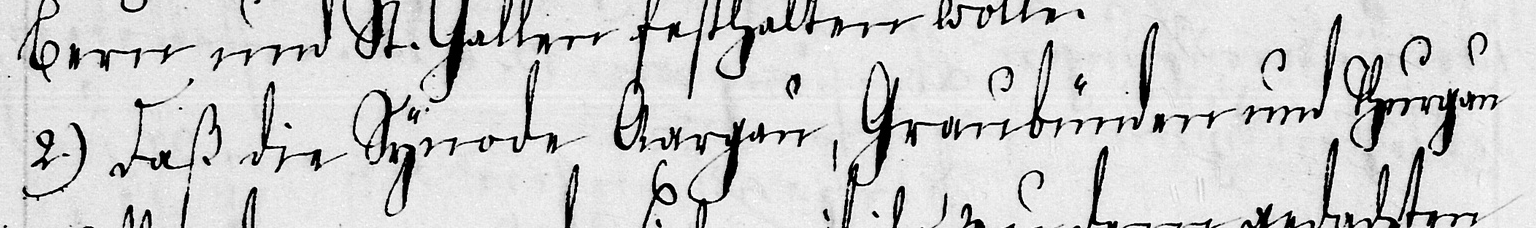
2.) Daß die Synode Aargau, Graubünden und Thurgau
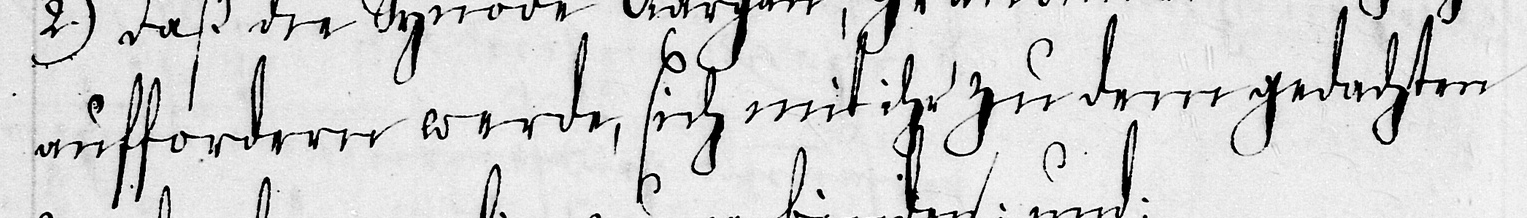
auffordern werde, sich mit ihr zu dem gedachten
